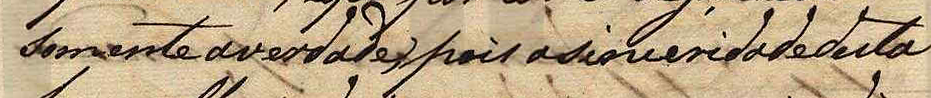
somente a verdade, pois a sinceridade desta
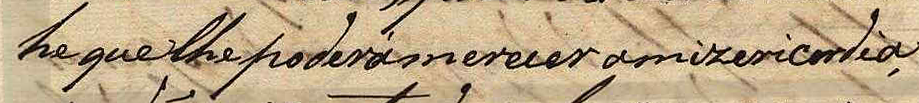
he que lhe poderá merecer a mizericordia,
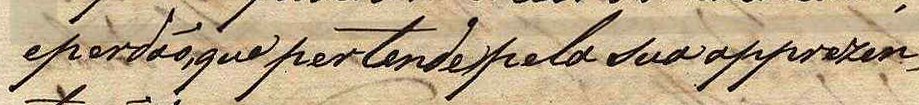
e perdaõ, que pertende pela sua apprezen
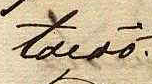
taçaõ.
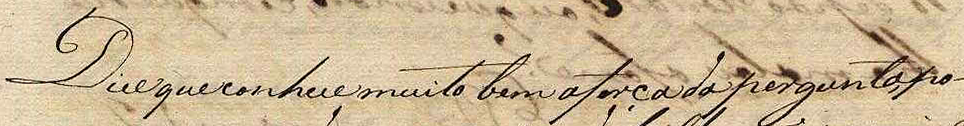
Dice que conhece muito bem a força da pergunta, po
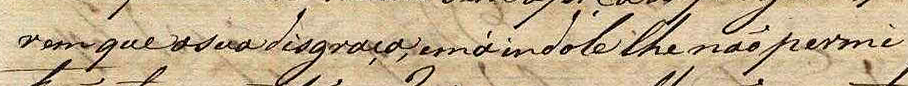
rem que a sua desgraça, e má indole lhe naõ permi
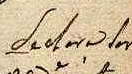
declara ser
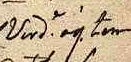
Verd.e o q̄ tem
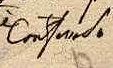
Confessado
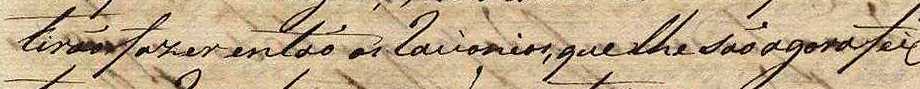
tirão fazer entaõ os Racionios, que lhe saõ agora fei
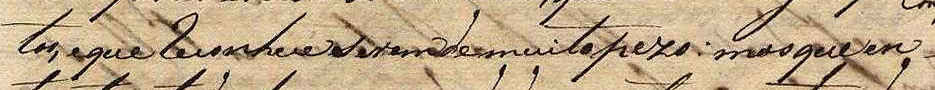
tos, e que Reconhece serem de muito pezo: mas que en
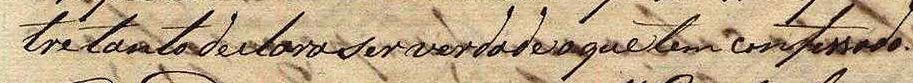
tretanto declara ser verdade o que tem confessado.
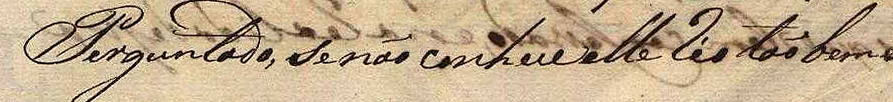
Perguntado, se naõ conhece elle Réo taõbem
